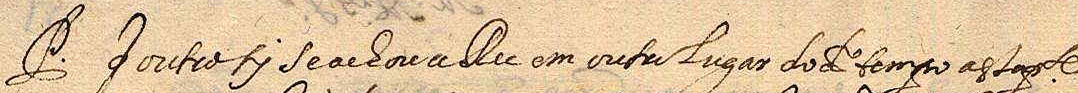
P. q̄ outrosy se achou a Ree em outro Lugar do d̄o tempo a esta pte.
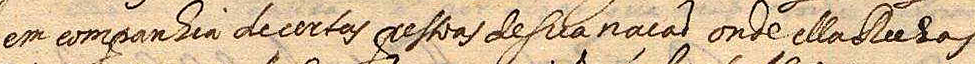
em companhia de certas pessoas de sua naçaõ onde ella Ree E as
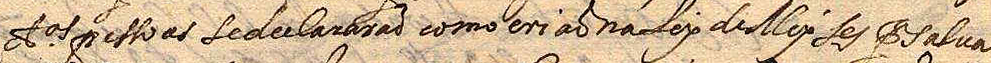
d̄.as pessoas se declararaõ como criaõ na Ley de Moyses pa salua
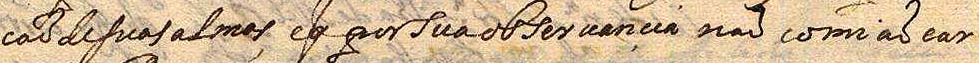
caõ de suas almas, e q̄ por sua obseruançia naõ comiaõ car
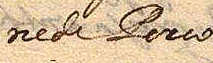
ne de Porco
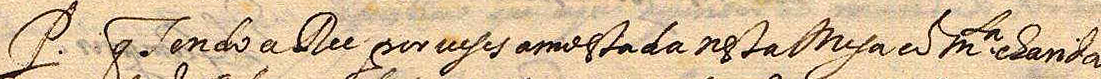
P. q̄ sendo a Ree por ueses amoestada nesta Mesa cō mta. charida
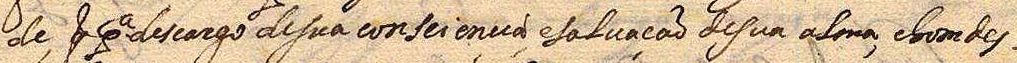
de, q̄ pa. descargo de sua consciençia, e saluaçaõ de sua alma, e bom des
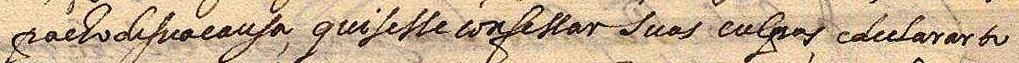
pacho de sua causa, quisesse confessar suas culpas, e declarar to
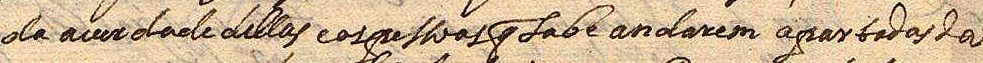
da a uerdade dellas, e as pessoas q̄ sabe andarem apartadas da
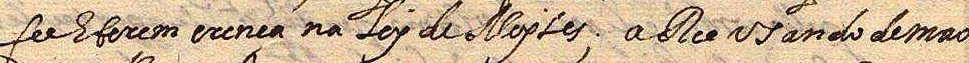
fee E terem crença na Ley de Moyses; a Ree vsando de mao
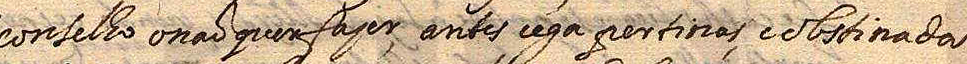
conselho o naõ quer fazer, antes, cega pertinas, e obstinada
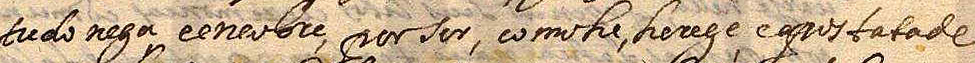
tudo nega, e encobre, por ser, como he, herege, e apostata de
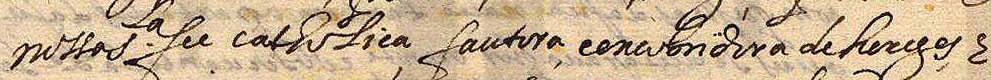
nossa sta. fee cathoLica, fautora, e encobridora de hereges, E
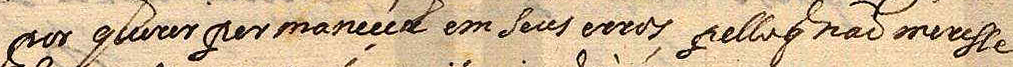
por querer permaneçer em seus erros, pello q̄ não meresse
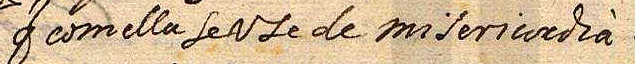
q̄ com ella se vse de misericordia.
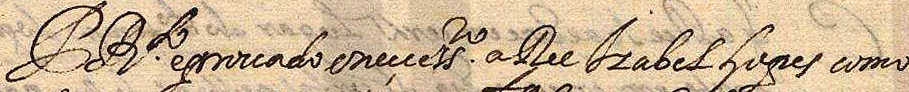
P R.to e prouado o neçessro. a Ree IzabeL Lopes como
